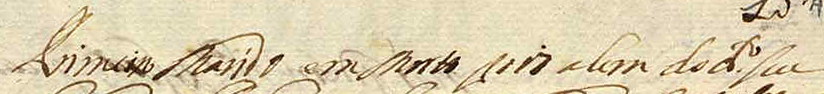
Primeiro Marido era Morto pois alem do d̄.o seu
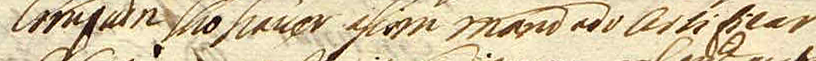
Compadre lho hauer assim mandado certificar
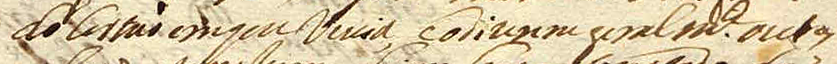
do Certaõ em que Viuia, e o dizerem geralm.te outras
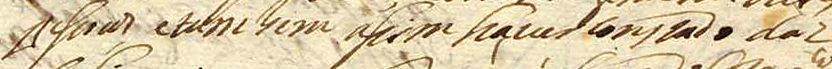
pessoas, e tambem assim hauer constado dar
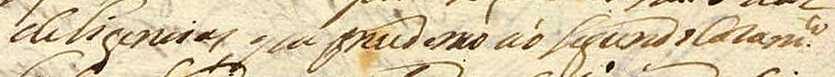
deligencias que precederaõ ao segundo Cazam.to
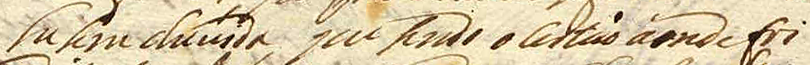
he sem duuida, que sendo ocasiaõ aonde foi
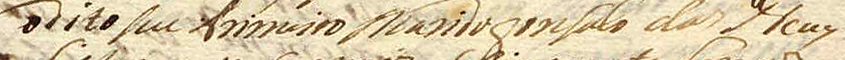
o dito seu Primeiro Marido gonsalo das Neues
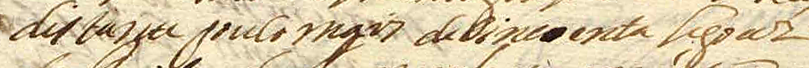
distante pouco mais de sincoenta legoaz
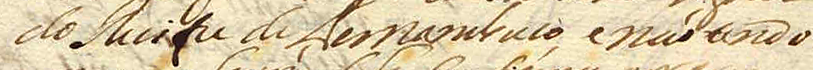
do Recife de Pernambuco, e naõ tendo
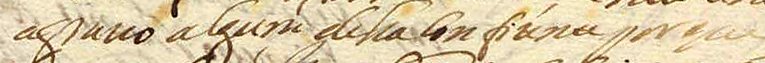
agrauo algum̄ della confitente porque
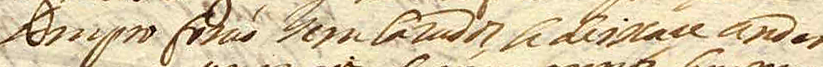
Sempre foraõ hora Cazados se deixace andar
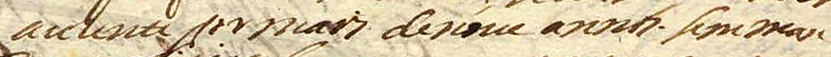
auzente por mais de noue annos. sem mais
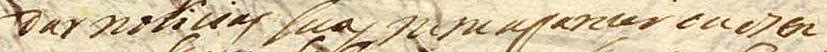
dar noticias suas nem aparecer ou escre
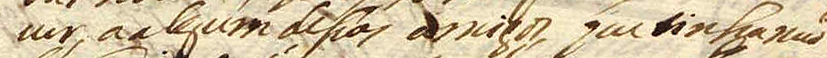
uer, a algum desses amigos que tinha não
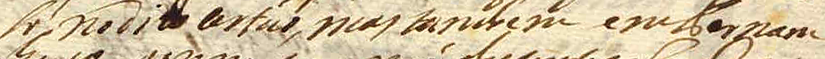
Ir no dito certão, mas tambem em Pernam
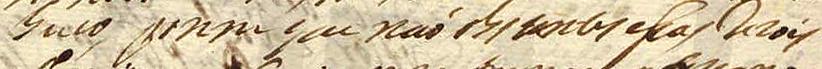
buco, porem que naõ obstantes essas Rezois
